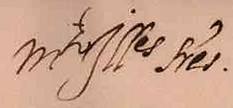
mto Jlles Srēs.
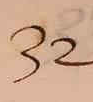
32
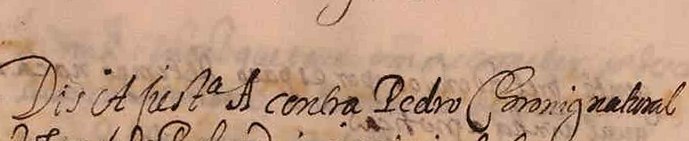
Dis A Justa A contra Pedro Chronig natural
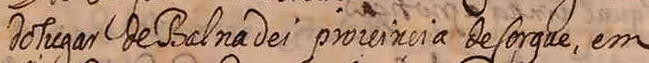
do lugar de Balnadei prouincia de Corque, em
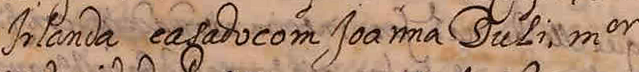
Jrlanda casado com Joanna Duli, mor
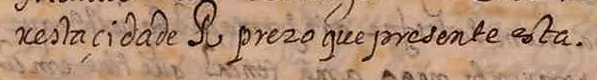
nesta çidade R prezo que presente esta.
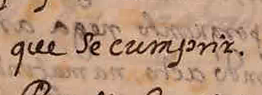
que se cumprir.
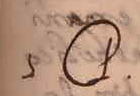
1 P.
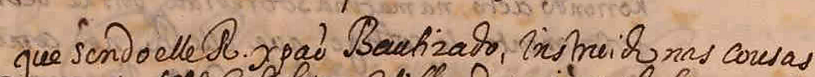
que sendo elle R. xpaõ Bautizado, instruido nas cousas
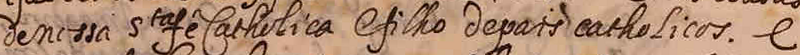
de nossa sta fe Catholica e filho de pais catholicos. E
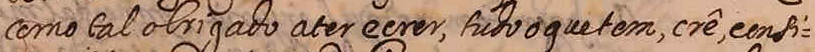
como tal obrigado a ter e crer, tudo o que tem, crê, e ensi
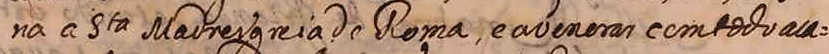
na a Sta Madre Igreia de Roma, e a venerar com todo aca
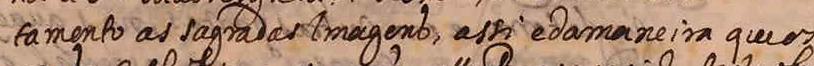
tamento as sagradas Imagens, assi e da maneira que os
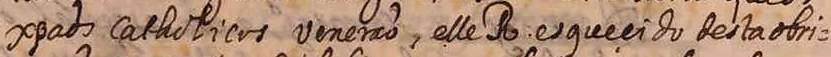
xpaõs catholicos veneraõ, elle R. esquecido desta obri
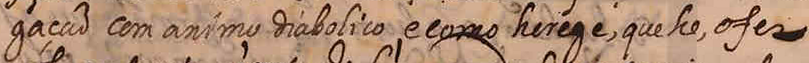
gaçaõ com animo diabolico, e como herege, que he, o fez
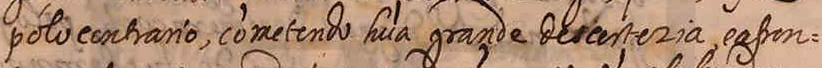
polo contrario, cometendo hua grande descertezia, e afron
